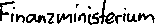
Finanzministerium
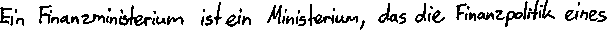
Ein Finanzministerium ist ein Ministerium, das die Finanzpolitik eines
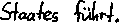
Staates führt.
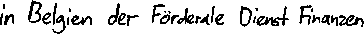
in Belgien der Föderale Öffentliche Dienst Finanzen
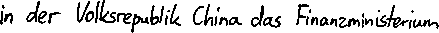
in der Volksrepublik China das Finanzministerium
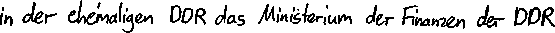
in der ehemaligen DDR das Ministerium der Finanzen der DDR
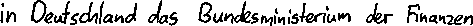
in Deutschland das Bundesministerium der Finanzen
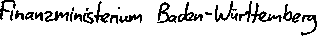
Finanzministerium Baden-Württemberg
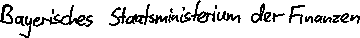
Bayerisches Staatsministerium der Finanzen
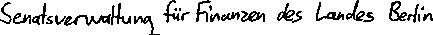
Senatsverwaltung für Finanzen des Landes Berlin
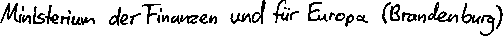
Ministerium der Finanzen und für Europa (Brandenburg)
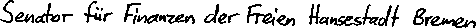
Senator für Finanzen der Freien Hansestadt Bremen
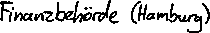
Finanzbehörde (Hamburg)
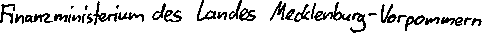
Finanzministerium des Landes Mecklenburg-Vorpommern
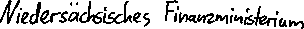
Niedersächsisches Finanzministerium
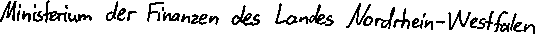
Ministerium der Finanzen des Landes Nordrhein-Westfalen
